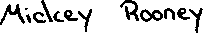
Mickey Rooney
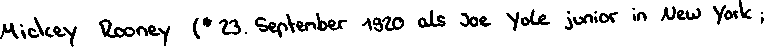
Mickey Rooney (* 23. September 1920 als Joe Yule junior in New York;
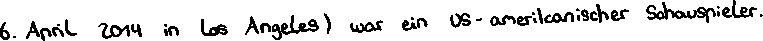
6. April 2014 in Los Angeles) war ein US-amerikanischer Schauspieler.
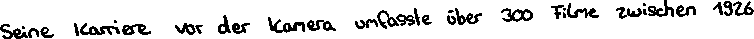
Seine Karriere vor der Kamera umfasste über 300 Filme zwischen 1926
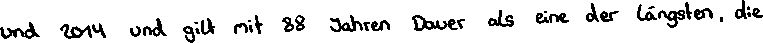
und 2014 und gilt mit 88 Jahren Dauer als eine der längsten, die
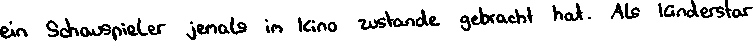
ein Schauspieler jemals im Kino zustande gebracht hat.Als Kinderstar
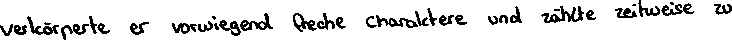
verkörperte er vorwiegend freche Charaktere und zählte zeitweise zu
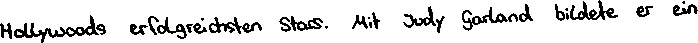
Hollywoods erfolgreichsten Stars. Mit Judy Garland bildete er ein
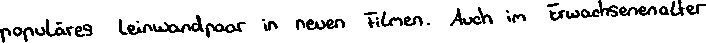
populäres Leinwandpaar in neun Filmen. Auch im Erwachsenenalter
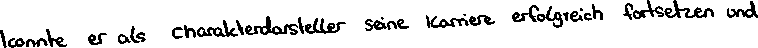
konnte er als Charakterdarsteller seine Karriere erfolgreich fortsetzen und
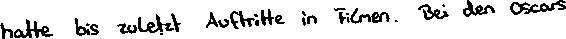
hatte bis zuletzt Auftritte in Filmen. Bei den Oscars
